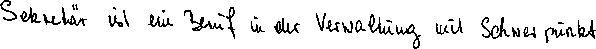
ekretär ist ein Beruf in der Verwaltung mit Schwerpunkt
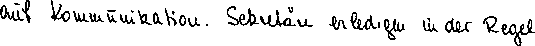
auf Kommunikation. Sekretäre erledigen in der Regel
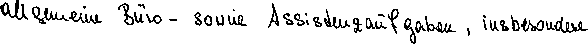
allgemeine Büro- sowie Assistenzaufgaben, insbesondere
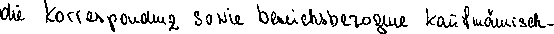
die Korrespondenz sowie bereichsbezogene kaufmännisch-
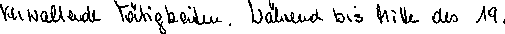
verwaltende Tätigkeiten. Während bis Mitte des 19.
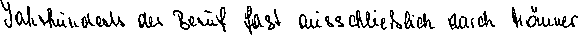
Jahrhunderts der Beruf fast ausschließlich durch Männer
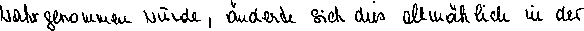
wahrgenommen wurde, änderte sich dies allmählich in der
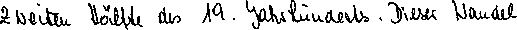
zweiten Hälfte des 19. Jahrhunderts. Dieser Wandel
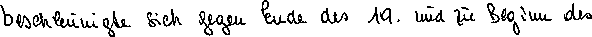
beschleunigte sich gegen Ende des 19. und zu Beginn des
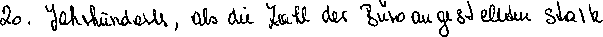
20. Jahrhunderts, als die Zahl der Büroangestellten stark
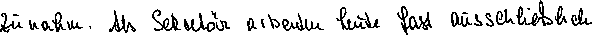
zunahm. Als Sekretär arbeiten heute fast ausschließlich
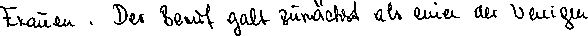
Frauen. Der Beruf galt zunächst als einer der wenigen
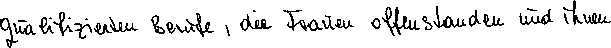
qualifizierten Berufe, die Frauen offenstanden und ihnen
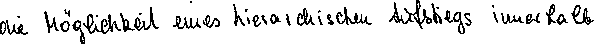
die Möglichkeit eines hierarchischen Aufstiegs innerhalb
